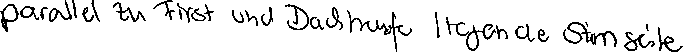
parallel zu First und Dachtraufe liegende Stirnseite
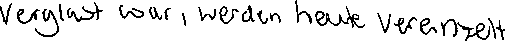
verglast war, werden heute vereinzelt
